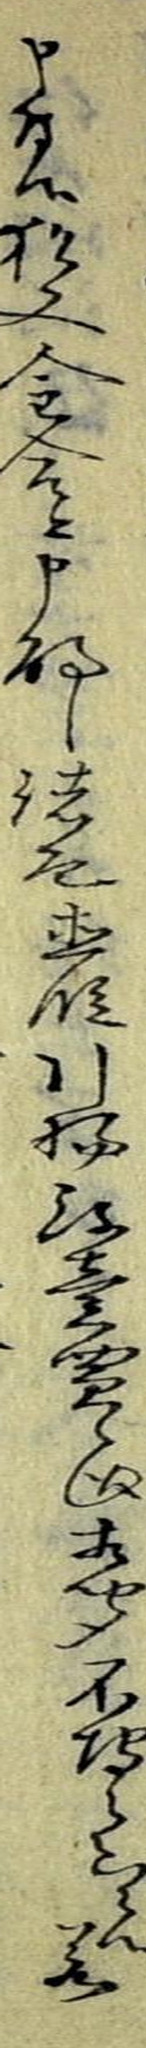申付候猶又金合と申触諸色直段引揚致売買候趣相聞不埒之至ニ候義
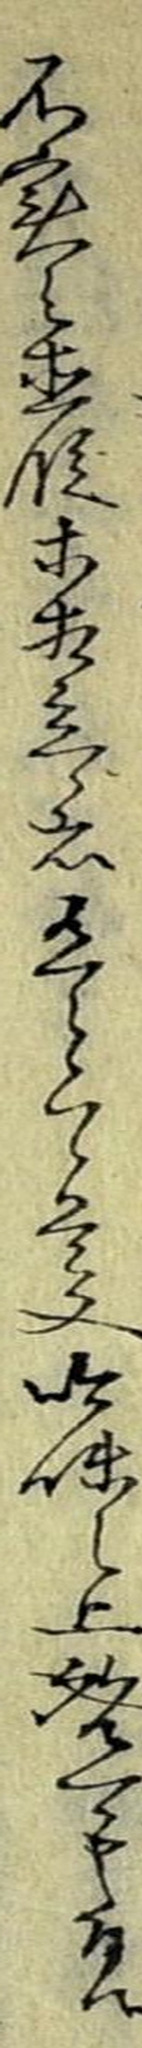不実之直段等相立候者有之候ハヽ是又吟味之上咎可申付候
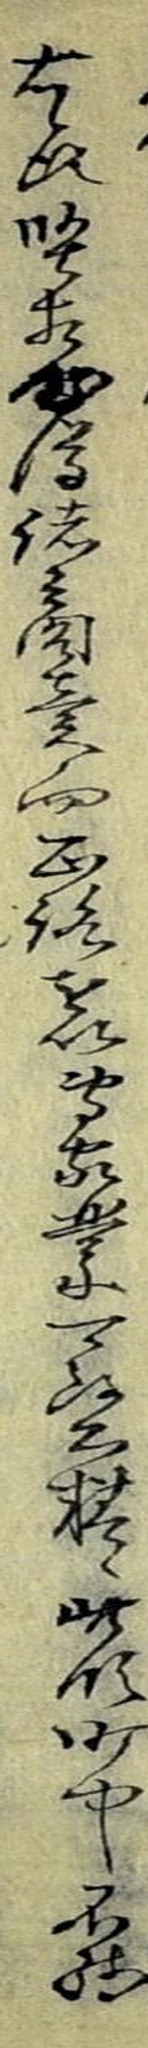右之趣堅相心得諸商売向正路を以専家業可致公精候此段町中不残
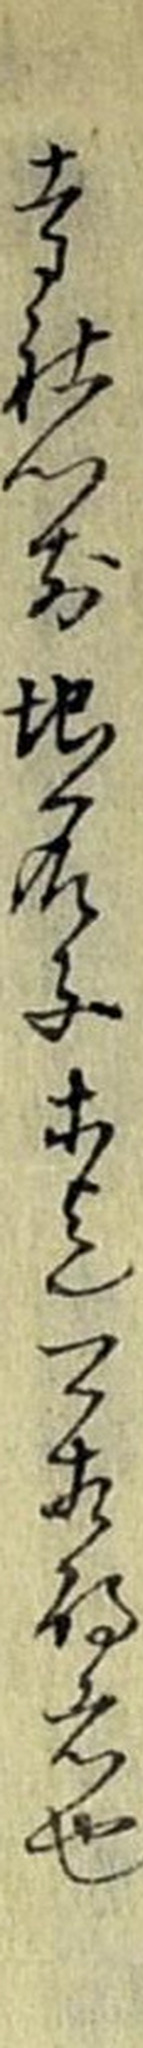寺社門前地名子等迄可相触者成
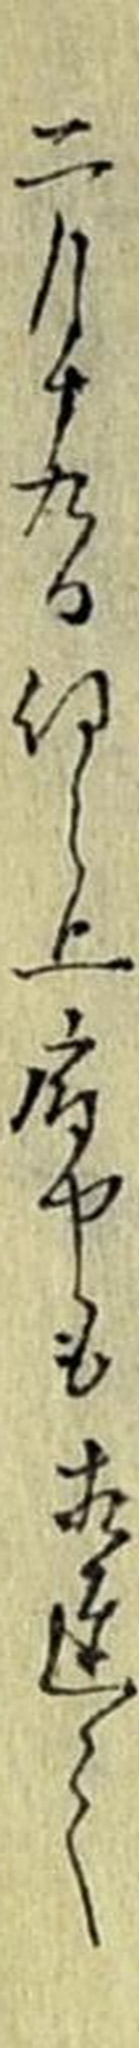二月十九日伺之上府中へも相達之
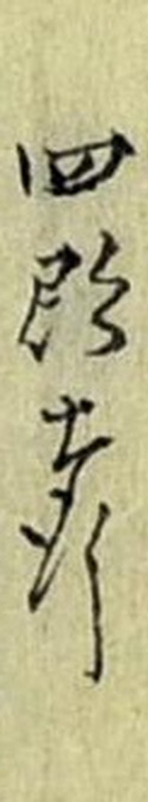四郡奉行
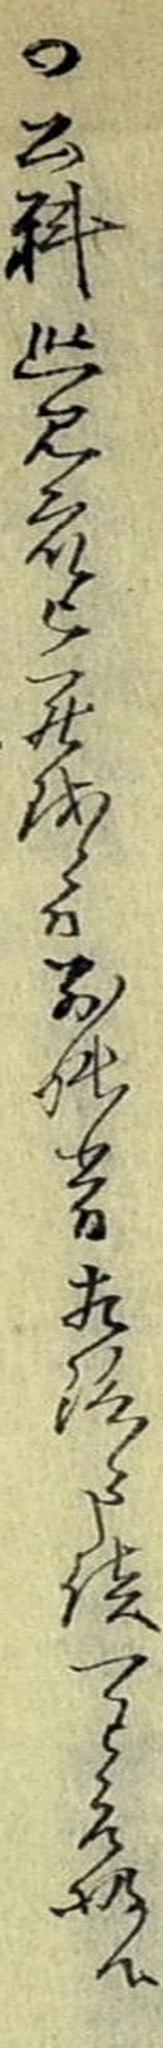○公料巡見衆罷罷越候ニ付別紙書付相渡申談可被取扱候
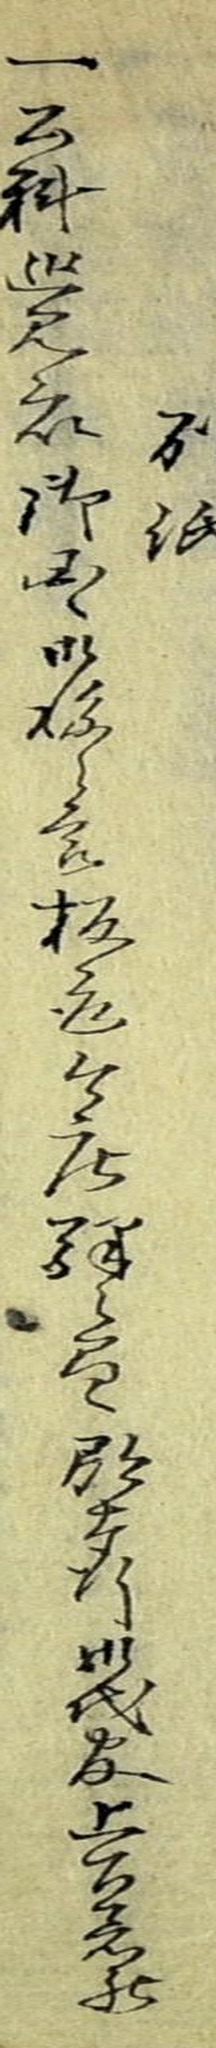一公料巡見衆御国へ御移之節板取今庄駅之間へ郡奉行御代官上下着居
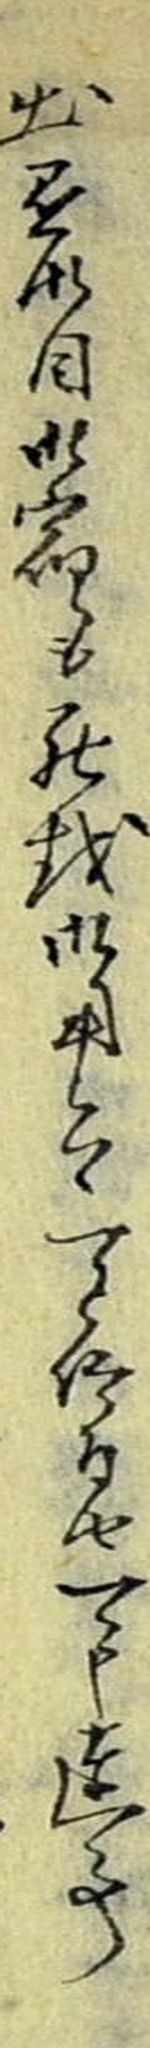出懸御目御宿へも罷越御用候ハヽ可被仰付由可申達事
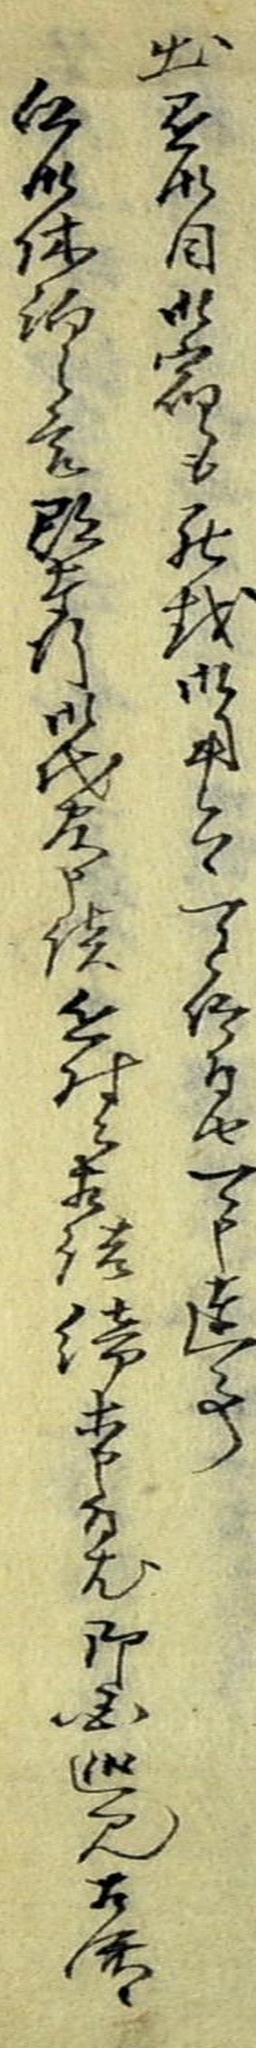但御休泊之節郡奉行御代官申談近村ニ相談締等申付尤御国巡見相済候

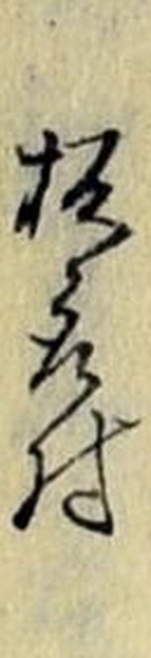板取村
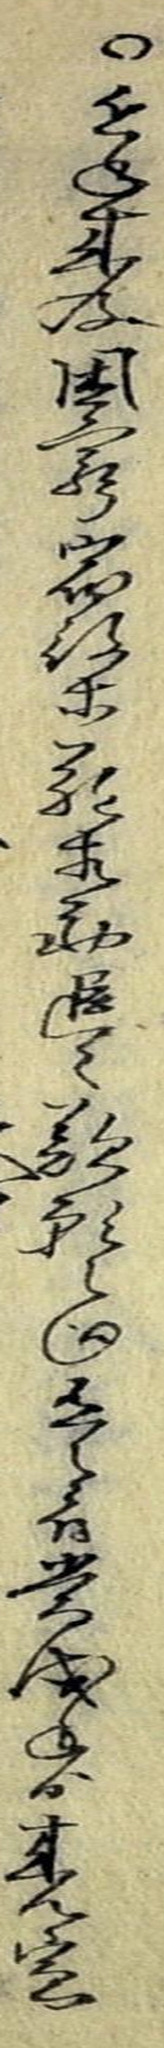○近年来及困窮宿役等難相勤追々歎願之趣有之ニ付当戌ゟ来ル寅
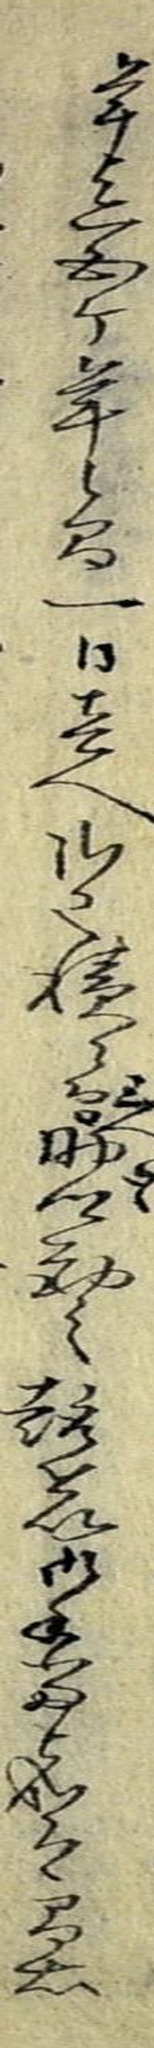年迄五ケ年之間壱日壱人弐也積ニ而三人ツヽ助郷之趣を以御手当被成下候間右
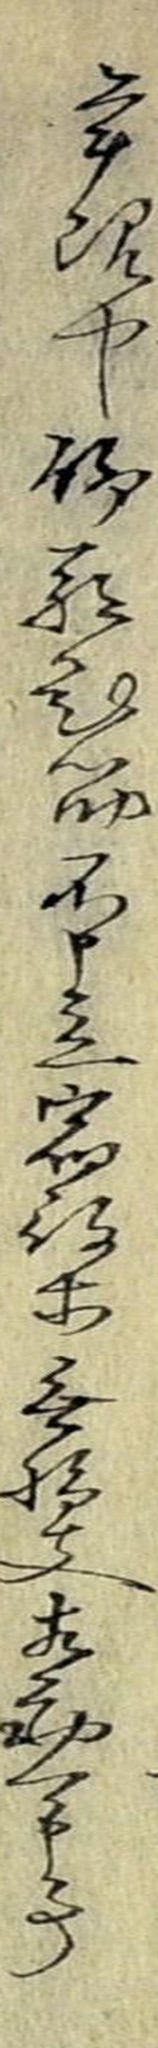年限中砌難義筋不申立宿役等無指支相勤可申事
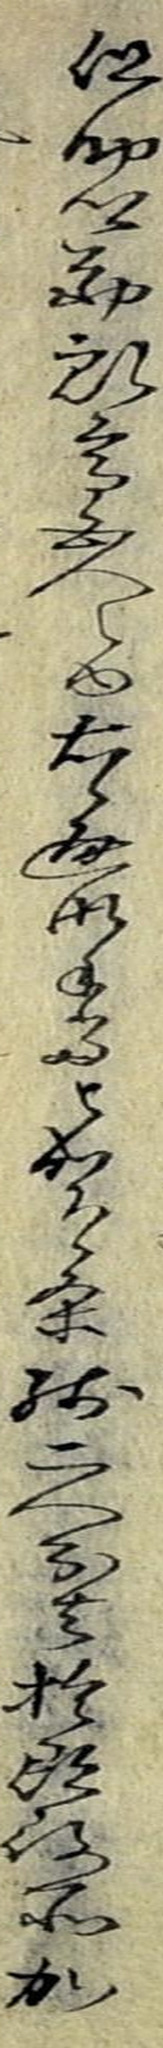但助郷勤願高五人之内右之通御手当被成下候条残二人分者御郡役所加
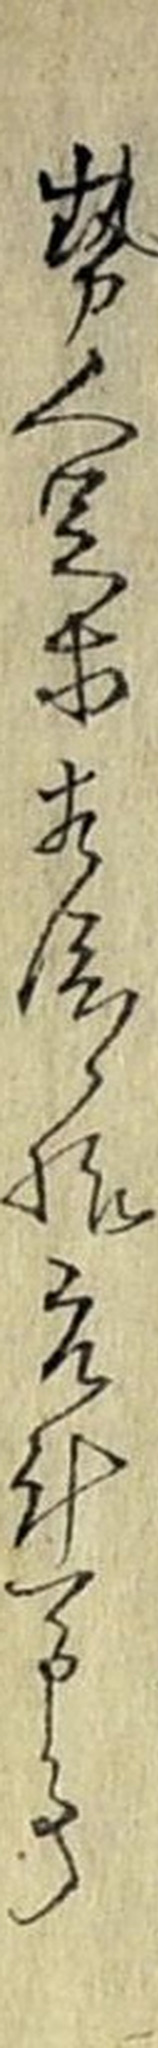勢人足等相渡候様取計可申事
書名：命令之部 五
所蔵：福井県文書館 Fukui Prefectural Archives
